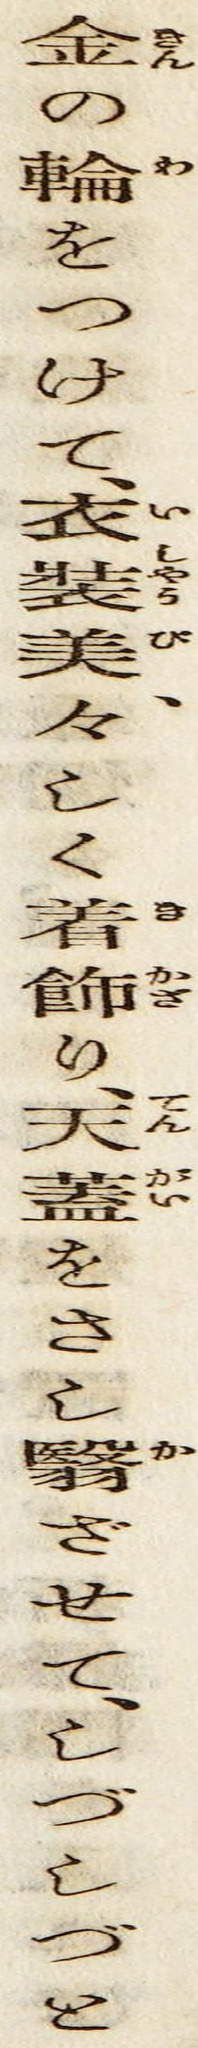金の輪をつけて、衣装美々しく着飾り、天蓋をさし翳ざせて、しづしづと
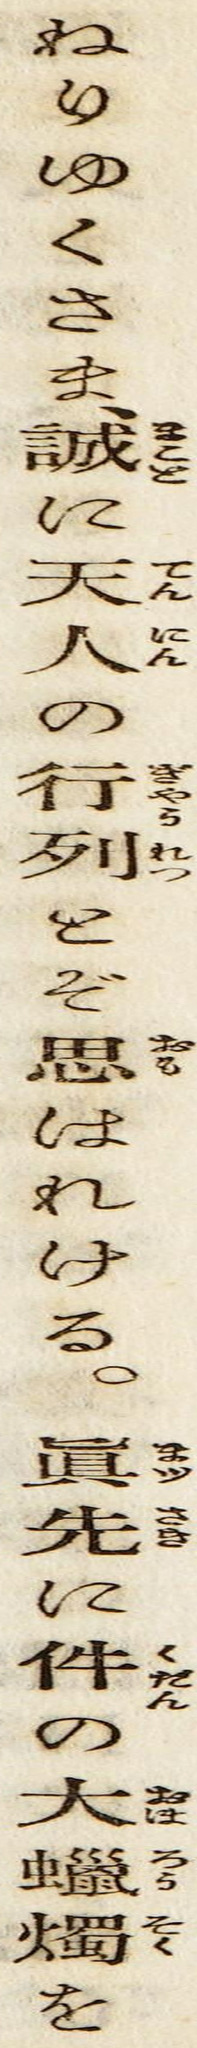ねりゆくさま、誠に天人の行列とぞ思はれける。真先に件の大蠟燭を
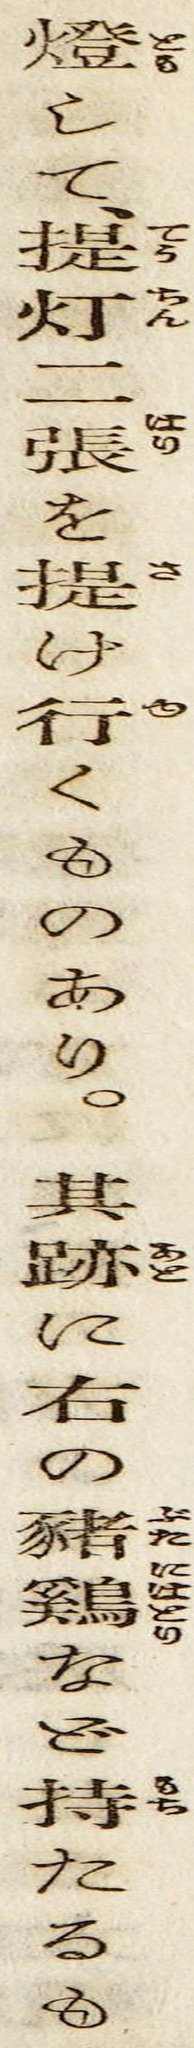灯して、提灯二張を提け行くものあり。其跡に右の猪鶏など持たるも

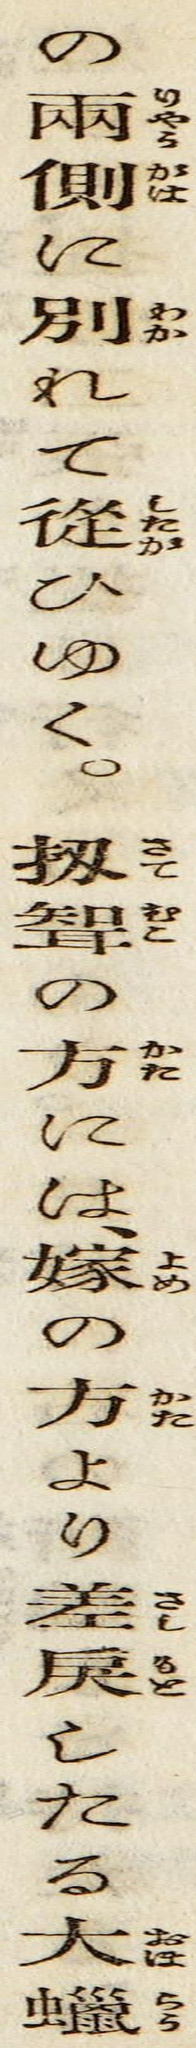の両側に別れて従ひゆく。扨婿の方には、嫁の方より差戻したる大蝋
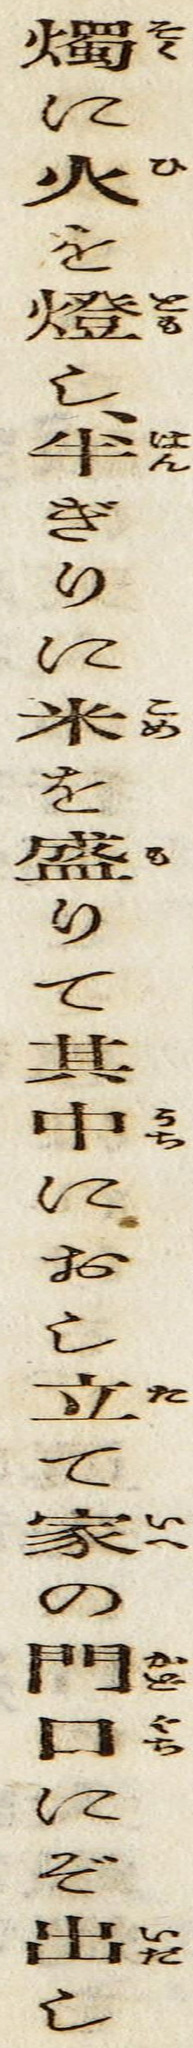燭に火を灯し、半ぎりに米を盛りて其中におし立て家の門口にぞ出し
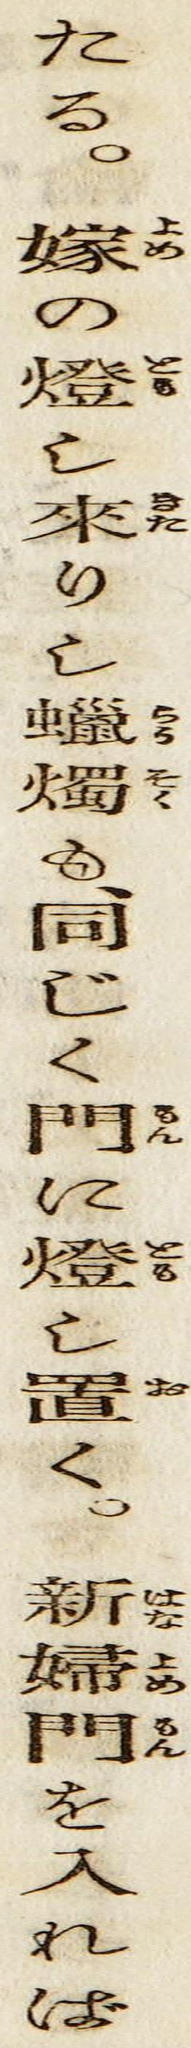たる。嫁の灯し来りし蝋燭も、同じく門に灯し置く。新婦門を入れば
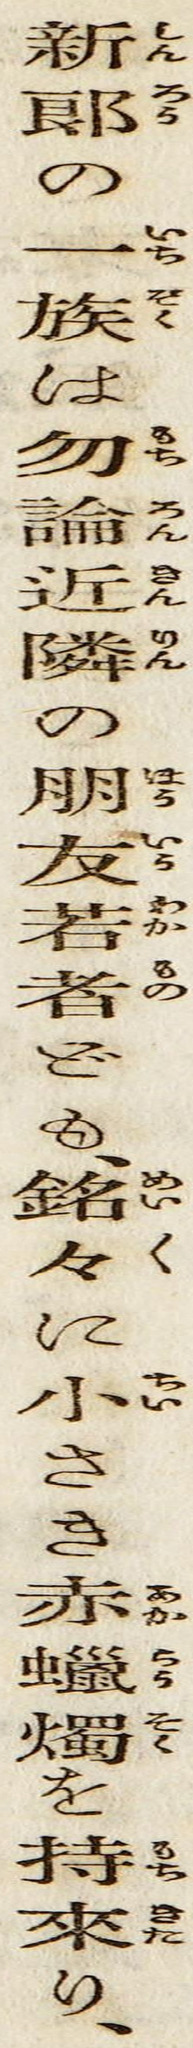新郎の一族は勿論近隣の朋友若者ども、銘々に小さき赤蝋燭を持来り、
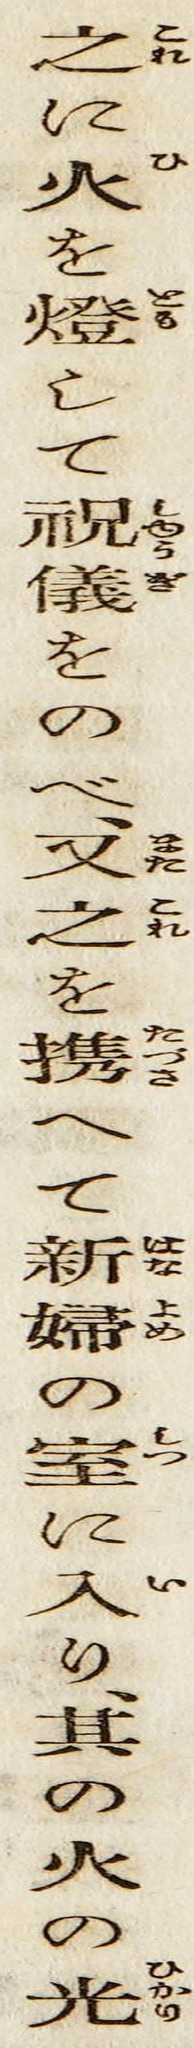之に火を灯して祝儀をのべ、又之を携へて新婦の室に入り、其の火の光
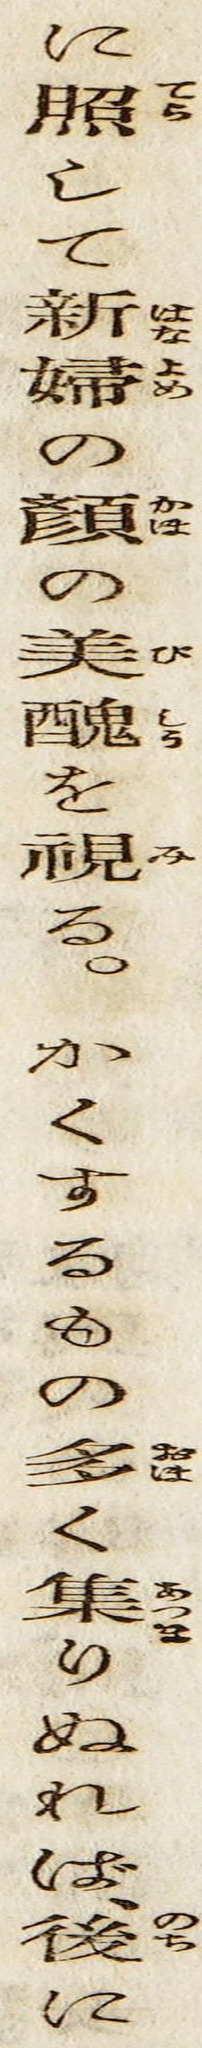に照して新婦の顔の美醜を視る。かくするもの多く集りぬれば、後に
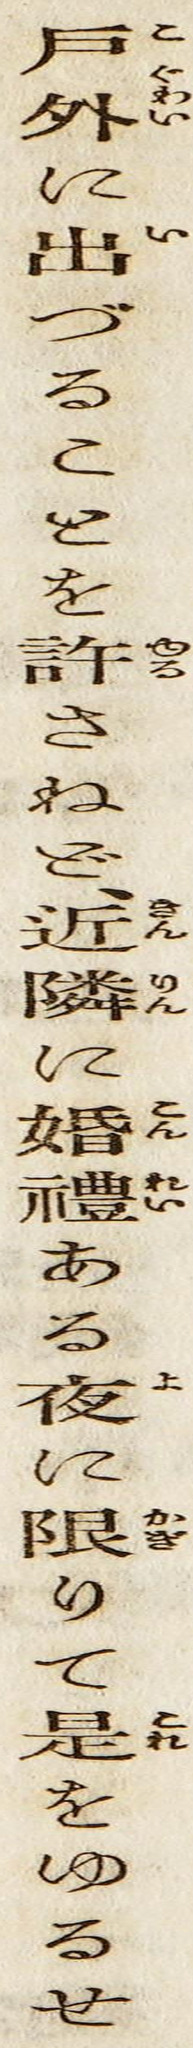戸外に出づることを許さねど、近隣に婚礼ある夜に限りて是をゆるせ
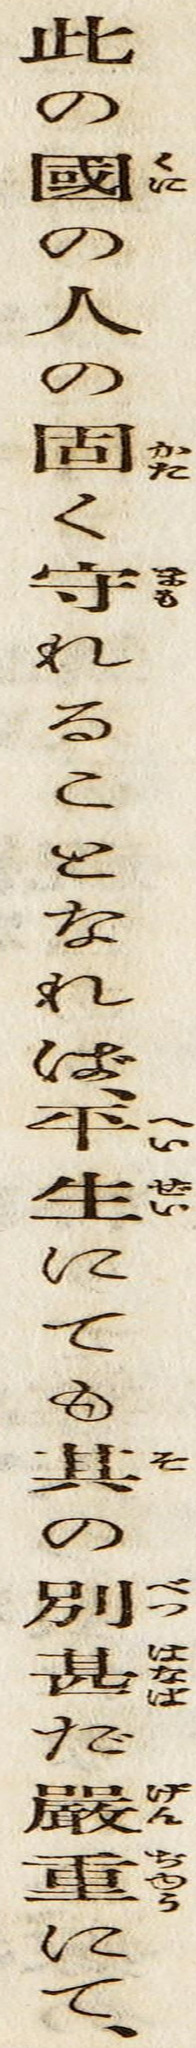此の国の人の固く守れることなれば、平生にても其の別甚だ厳重にて、
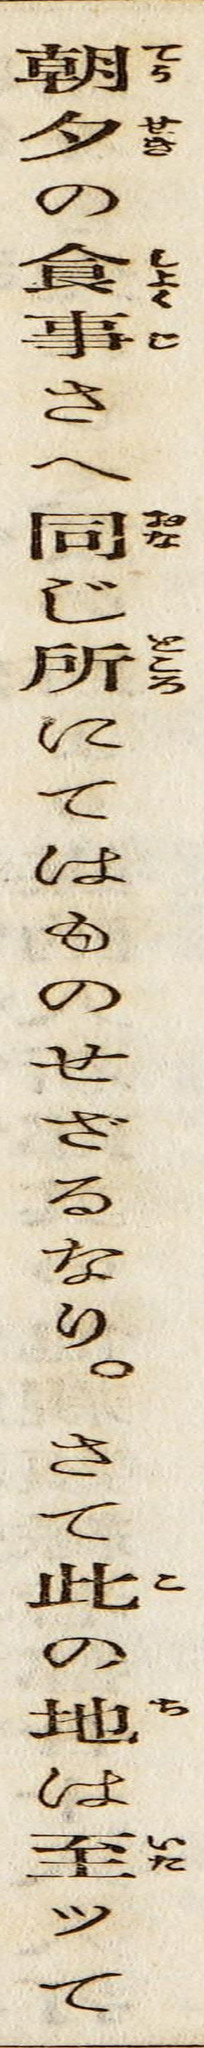朝夕の食事さへ同じ所にてはものせざるなり。さて此の地は至ツて
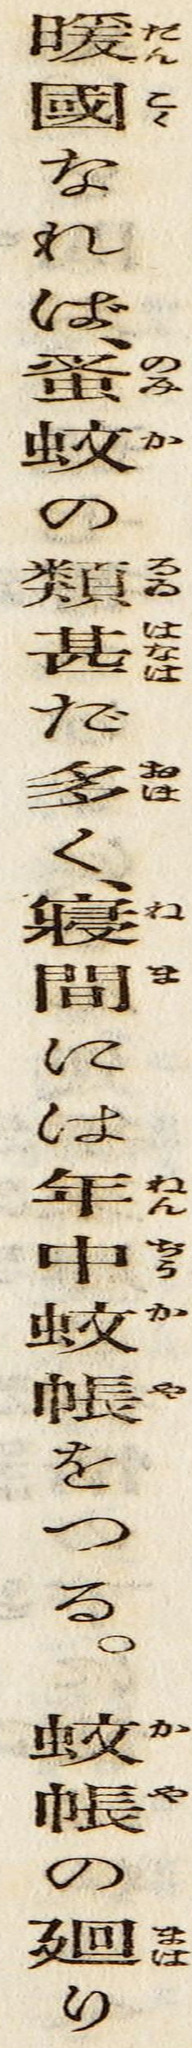暖国なれば、蚤蚊の類甚だ多く、寝間には年中蚊帳をつる。蚊帳の廻り
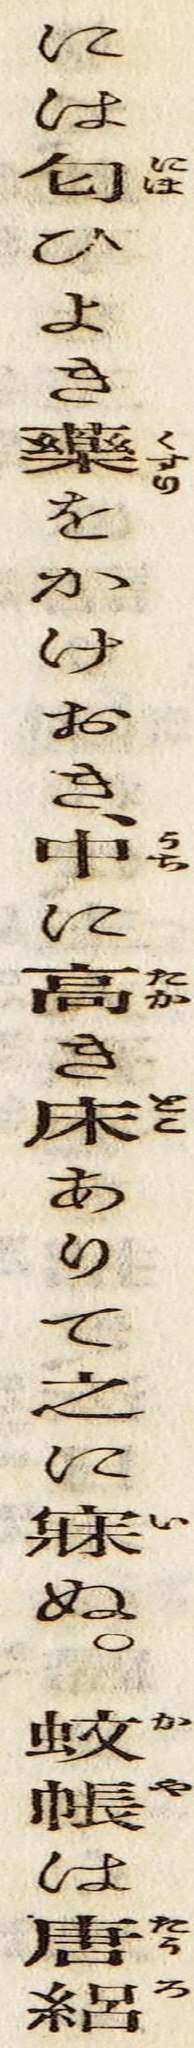には匂ひよき薬をかけおき、中に高き床ありて之に寐ぬ。蚊帳は唐絽
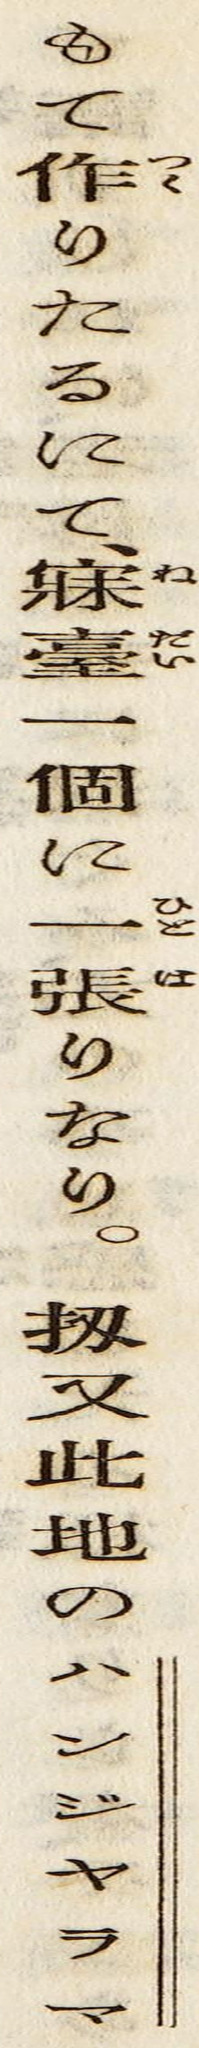もて作りたるにて、寐台一個に一張りなり。扨又此地のハンジヤラマ
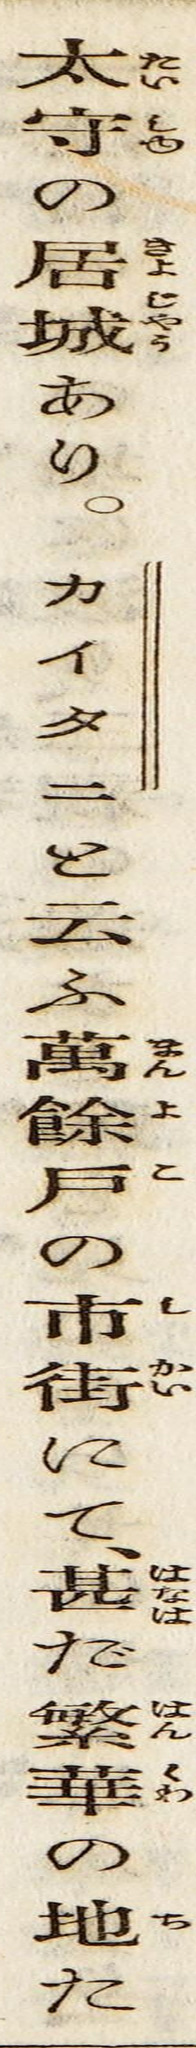太守の居城あり。カイタニと云ふ万余戸の市街にて、甚だ繁華の地た
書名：日本漂流譚
